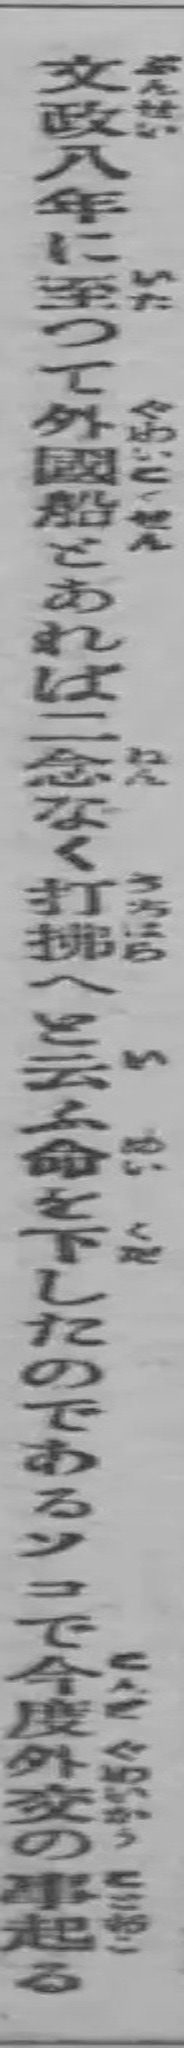文政八年に至つて外国船とあれば二念なく打払へと云ふ命を下したのであるソコで今度外交の事起る
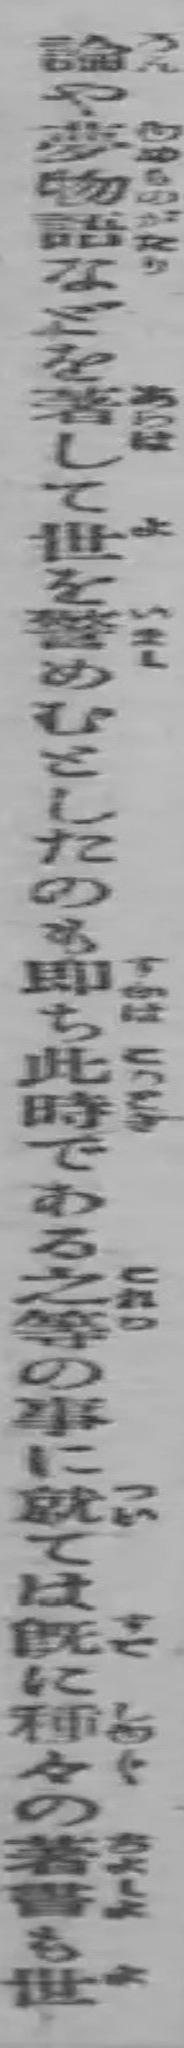論や夢物語などを著し世を警めむとしたのも即ち此時である之等の事に就ては既に種々の著書も世

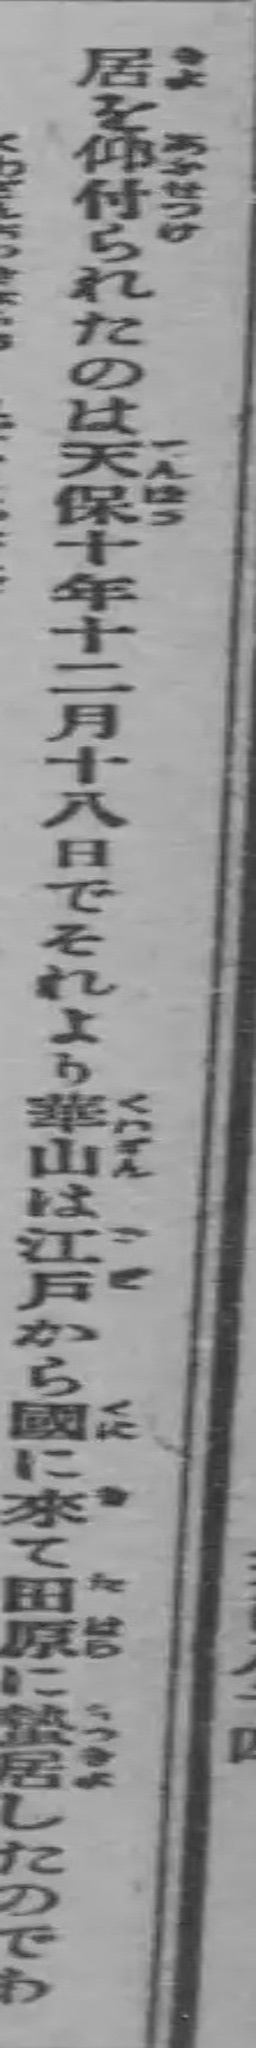居を仰付られたのは天保十年十二月十八日でそれより崋山は江戸から国に来て田原に蟄居したのであ
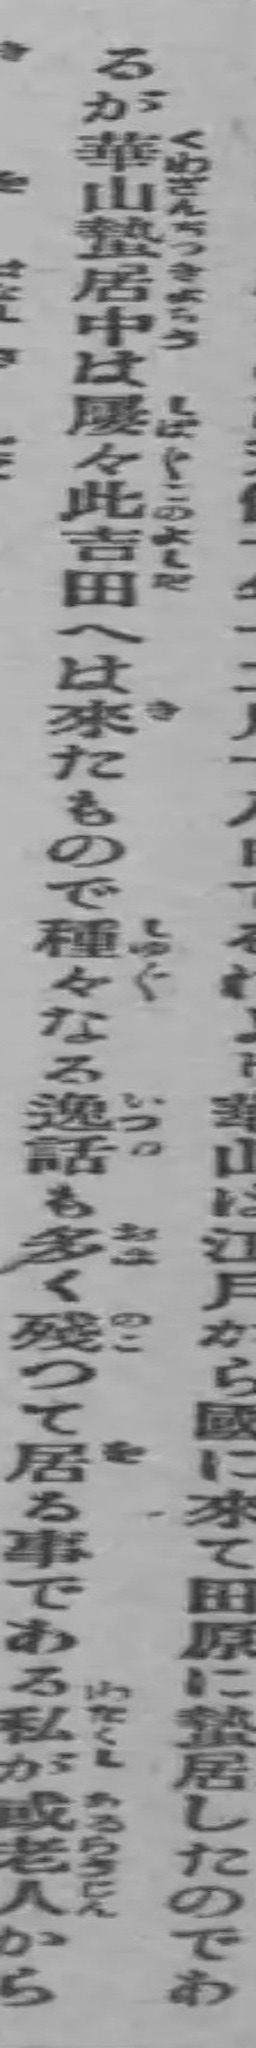るが崋山蟄居中は屡々此吉田へは来たもので種々なる逸話も多く残つて居る事である私が或老人から
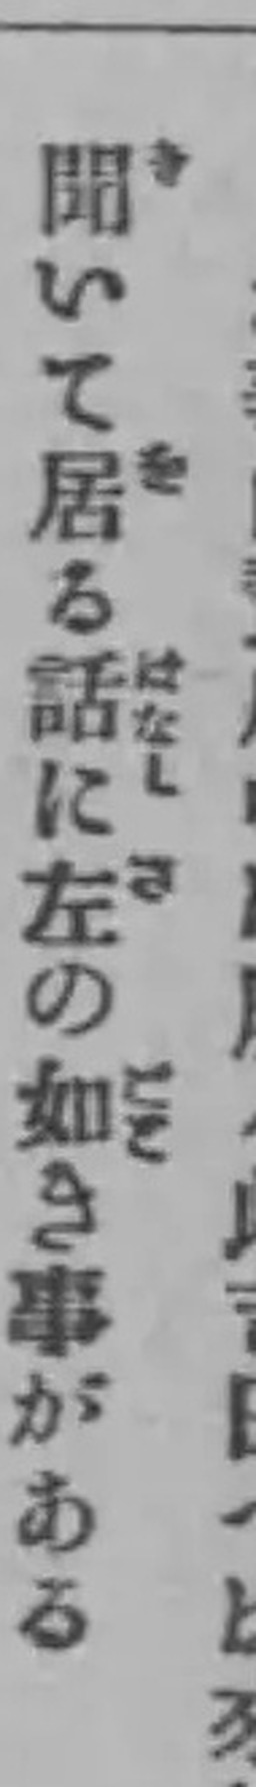聞いて居る話に左の如き事がある
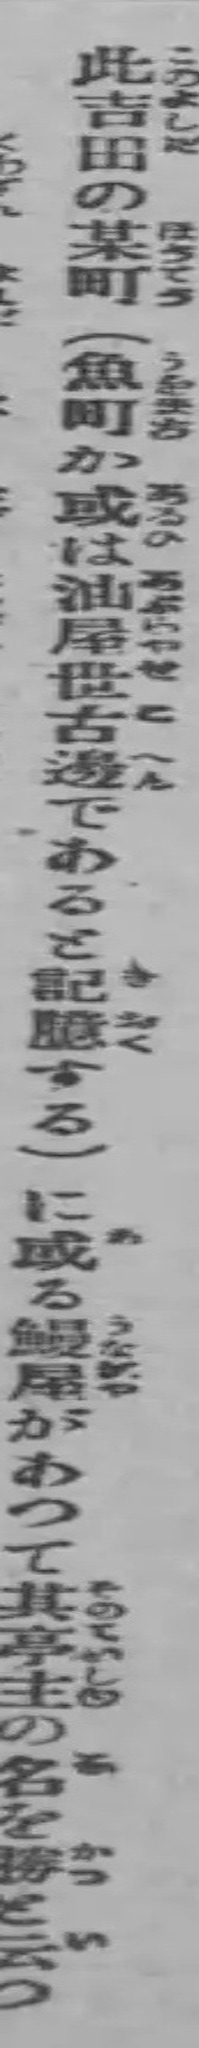此吉田の某町(魚町か或は油屋世古辺であると記憶する)に或る鰻屋があつて其亭主の名を勝と云つ
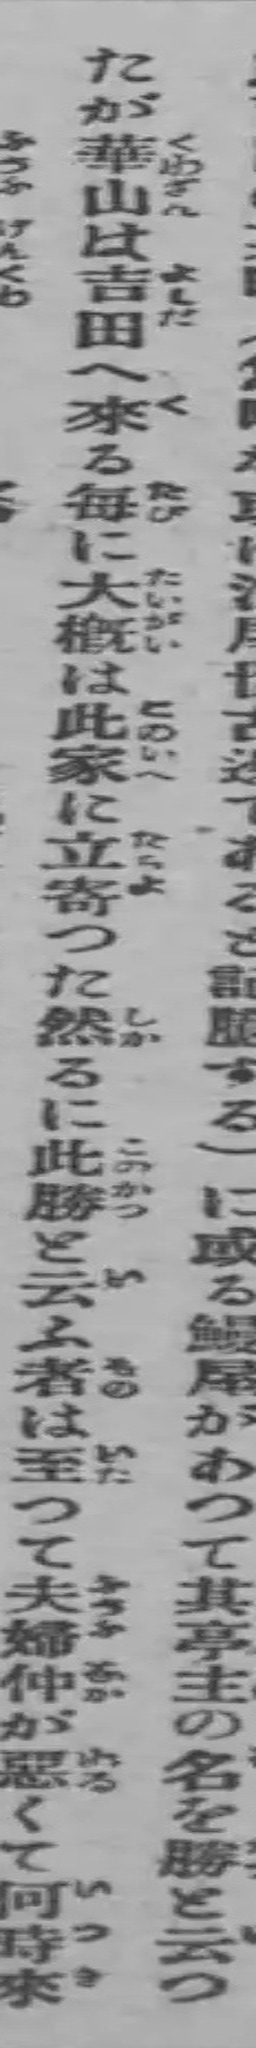たが崋山は吉田へ来る毎に大概は此家に立寄つた然るに此勝と云ふ者は至つて夫婦仲が悪くて何時来
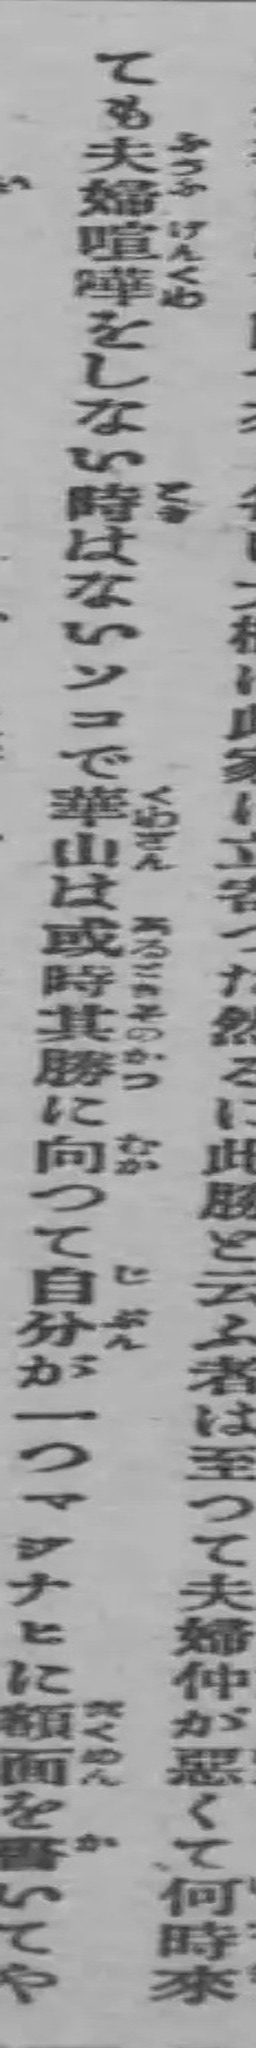ても夫婦喧嘩をしない時はないソコで崋山は或時其勝に向つて自分が一つマジナヒに額面を書いてや
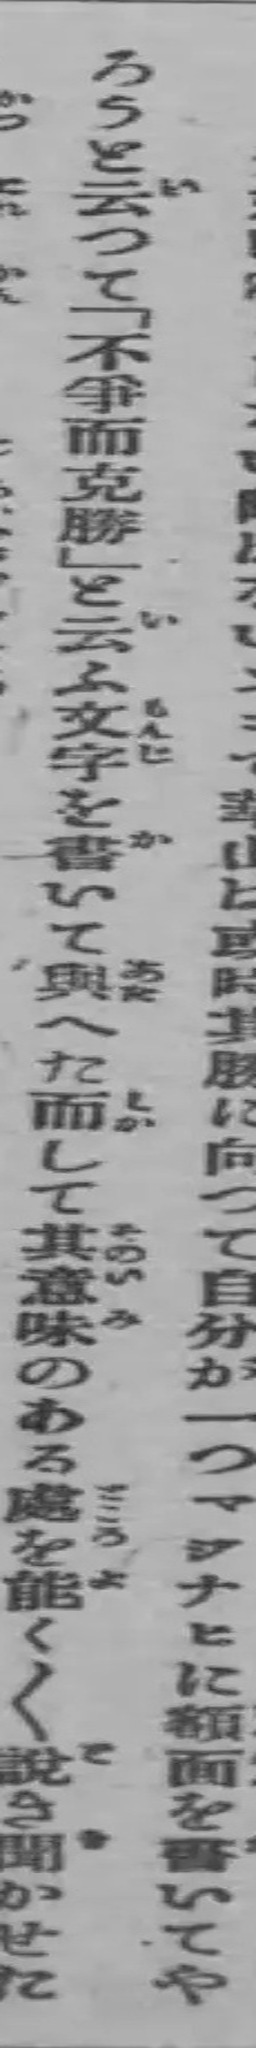ろうと云つて「不争而克勝」と云ふ文字を書いて与へた而して其意味のある処を能く〳〵説き聞かせた
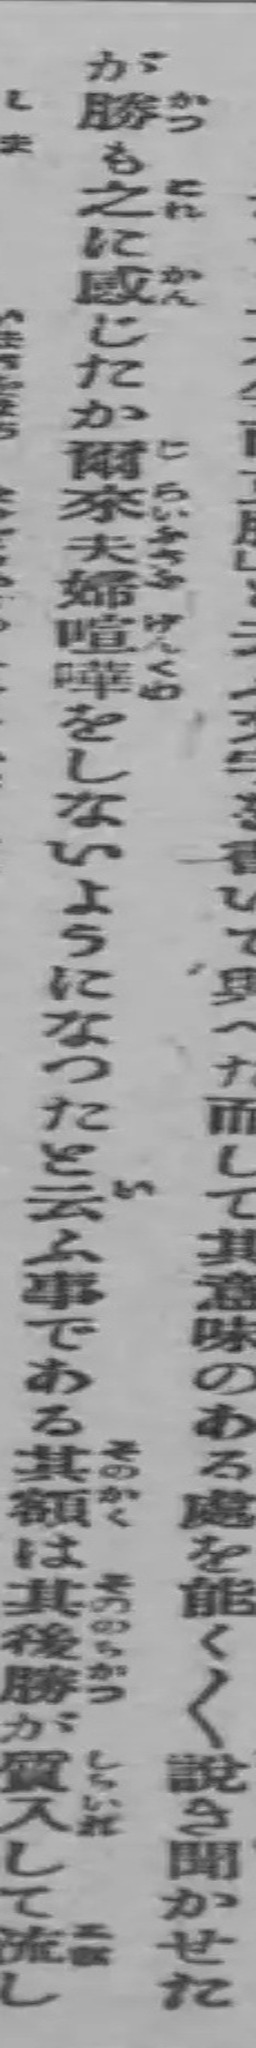が勝も之に感じたか爾来夫婦喧嘩をしないようになつたと云ふ事である其額は其後勝が質入して流し
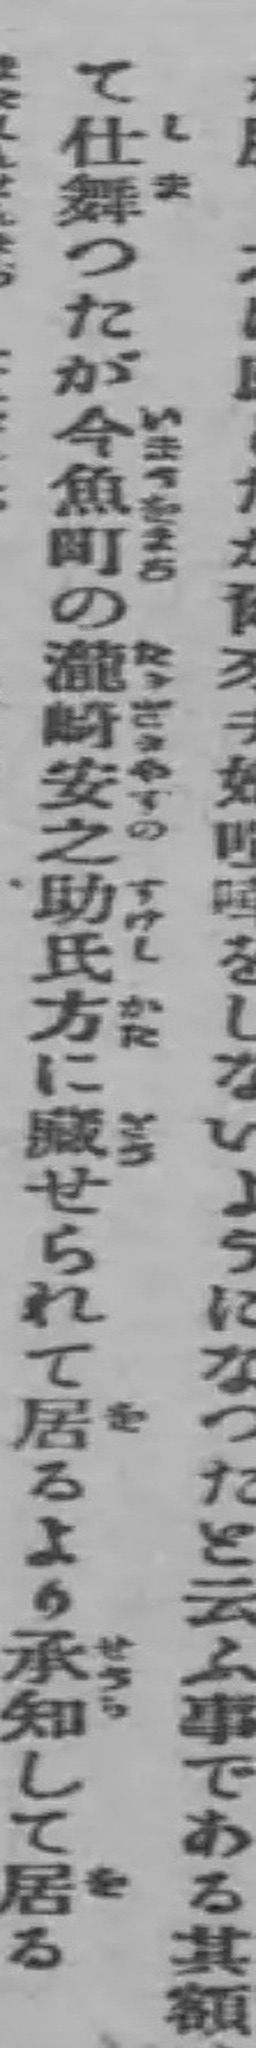て仕舞つたが今魚町の瀧崎安之助氏方に蔵せられて居るより承知して居る
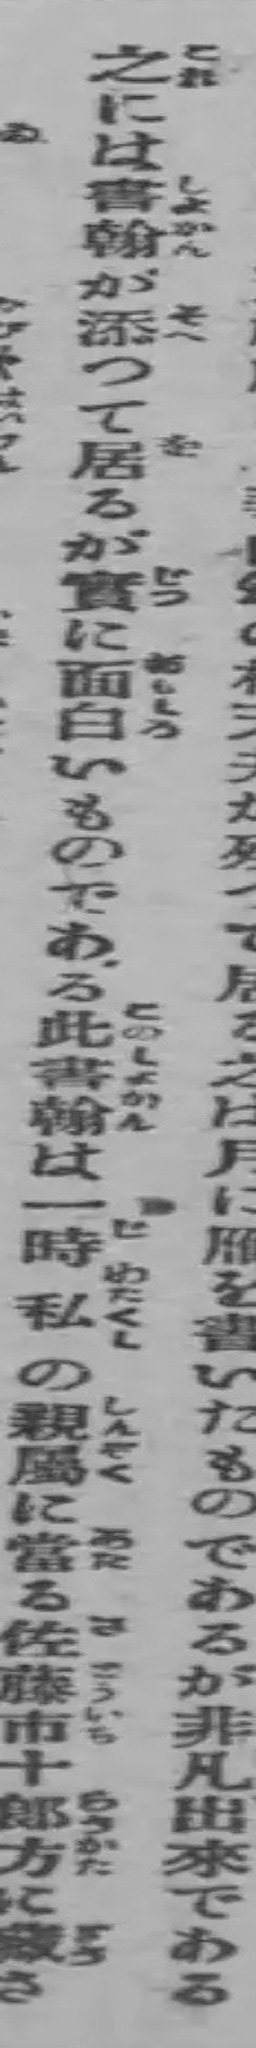之には書翰が添つて居るが実に面白いものである此書翰は一時私の親属に当る佐藤市十郎方に蔵さ
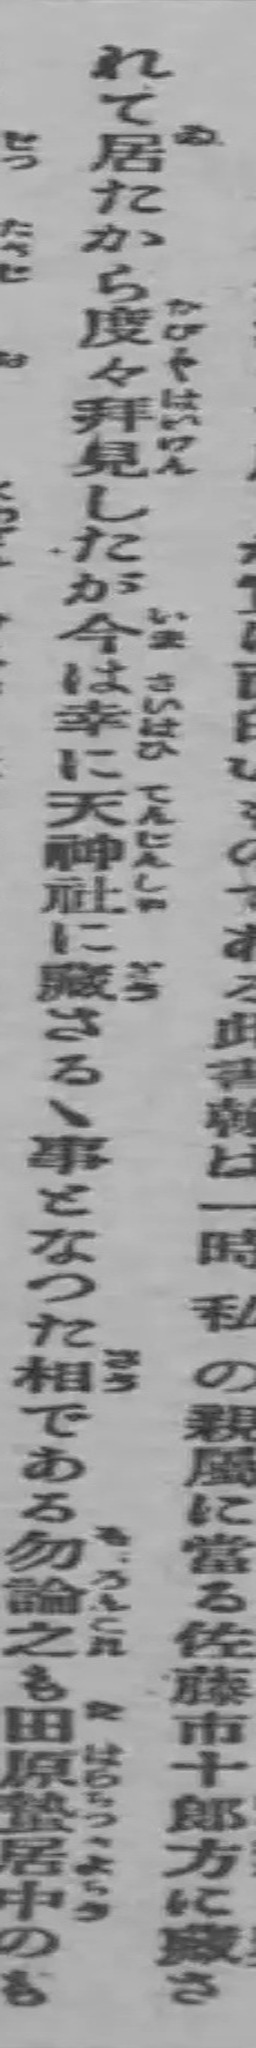れて居たから度々拝見したが今は幸に天神社に蔵さるゝ事となつた相である勿論之も田原蟄居中のも
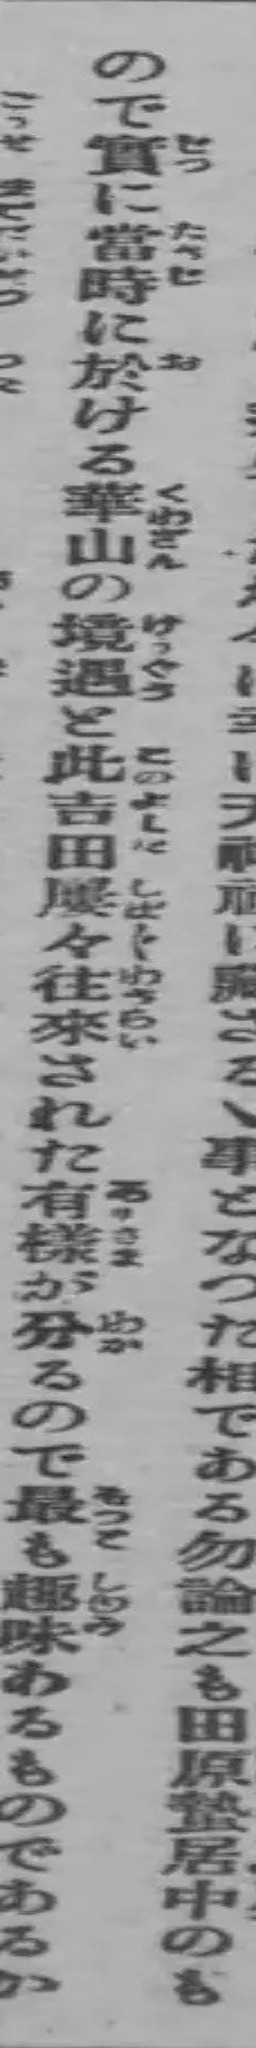ので実に当時に於ける崋山の境遇と此吉田屡々往来された有様が分るので最も趣味あるものであるか
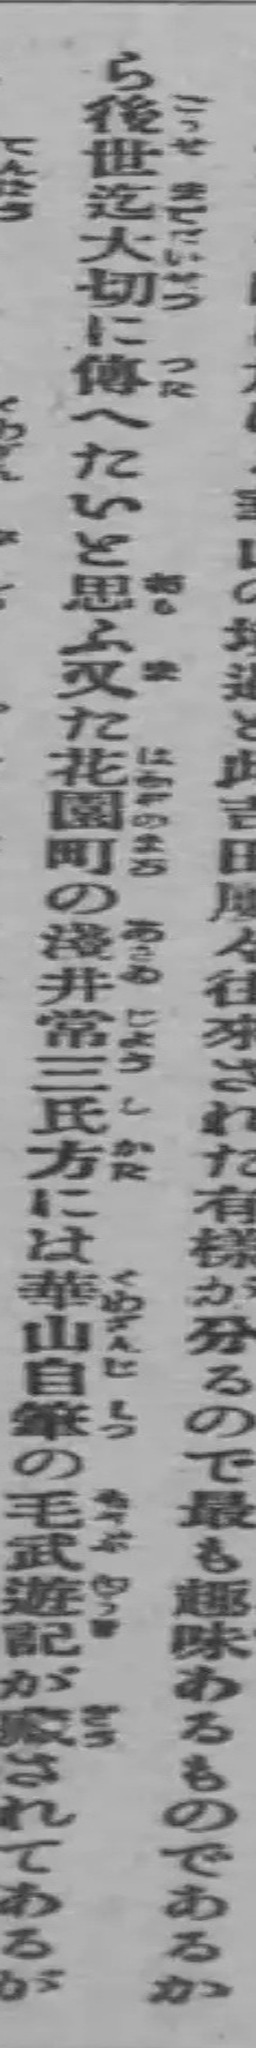崋山の日記ら後世迄大切に伝へたいと思ふ又た花園町の浅井常三氏方には崋山自筆の毛武遊記が蔵されてあるが
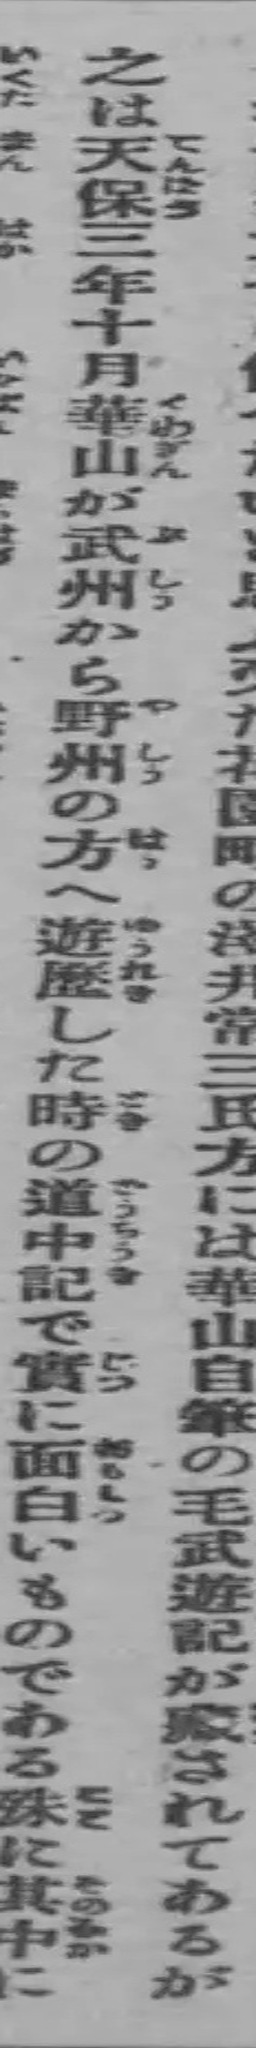之は天保三年十月崋山が武州から野州の方へ遊歴した時の道中記で実に面白いものである殊に其中に
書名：豊橋市史談
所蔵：国立国会図書館 National Diet Library, JAPAN
